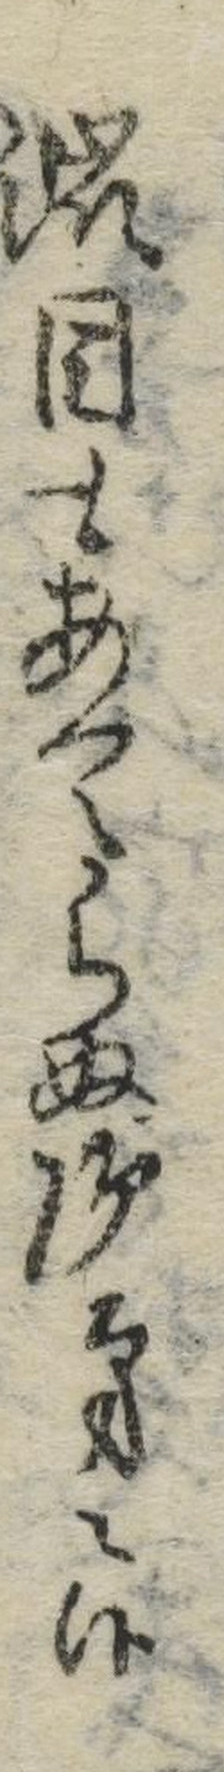渋目もあてらぬ次第ニ候
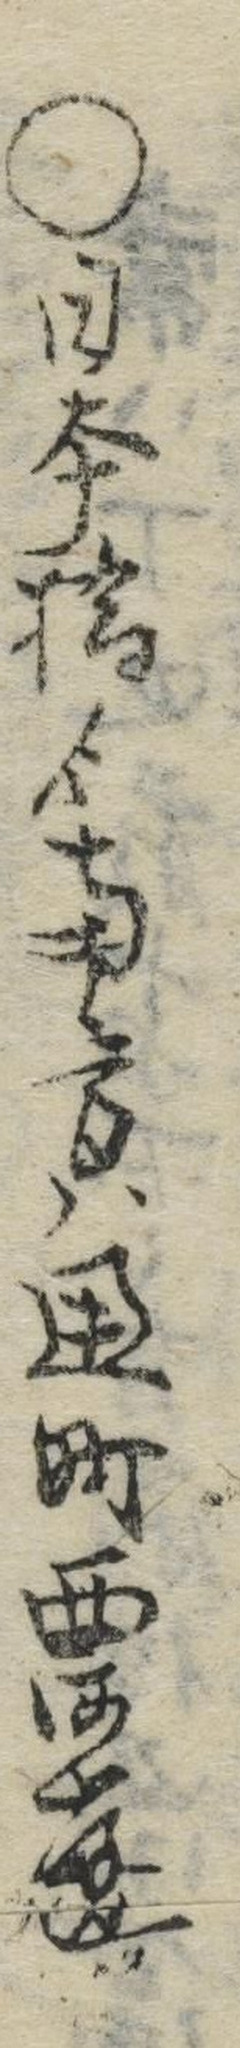○日本橋ゟ南之方ハ麹町西河岸辺
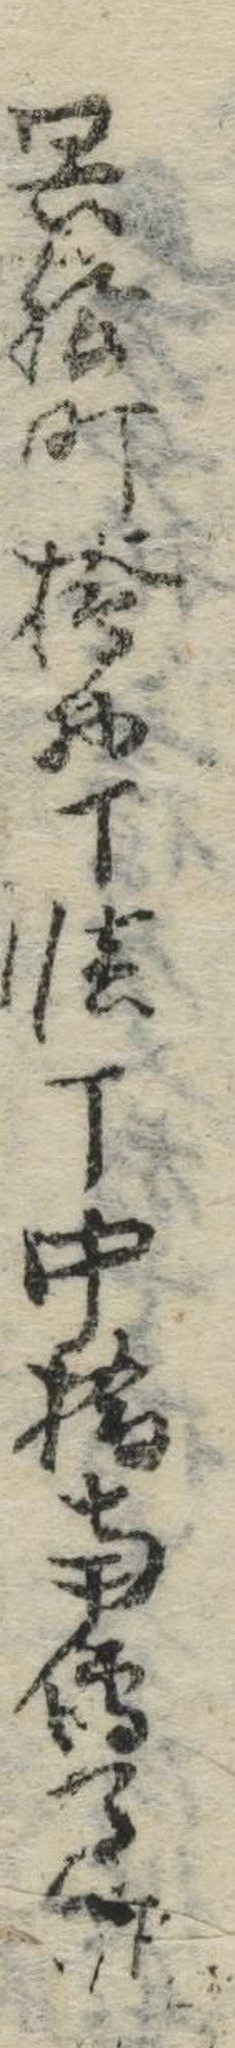呉服丁檜物丁槙丁中橋南伝馬町
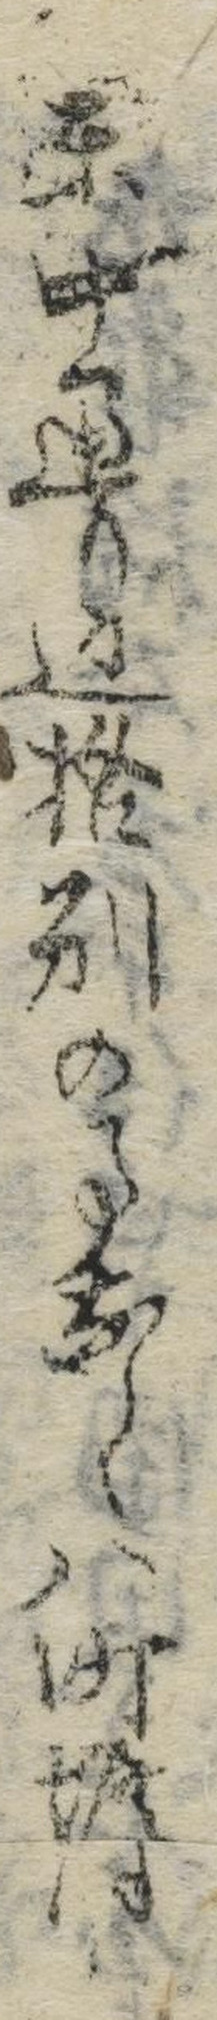東中通り辺格別の事なく八町堀向
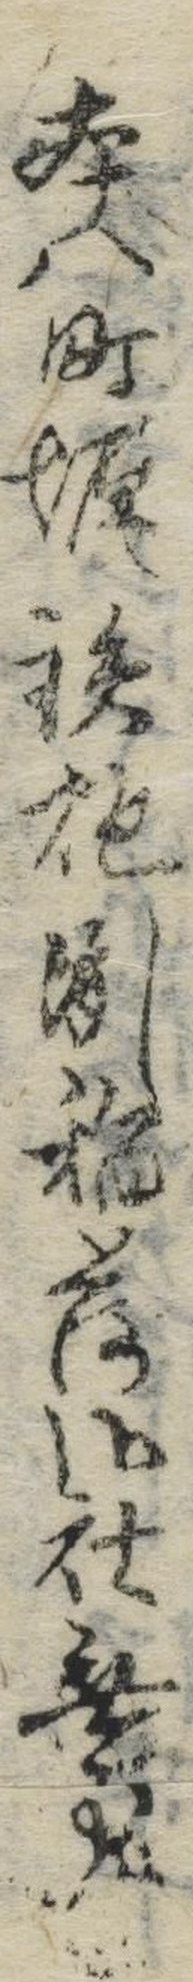本八町堀鉄炮洲稲荷御社無事
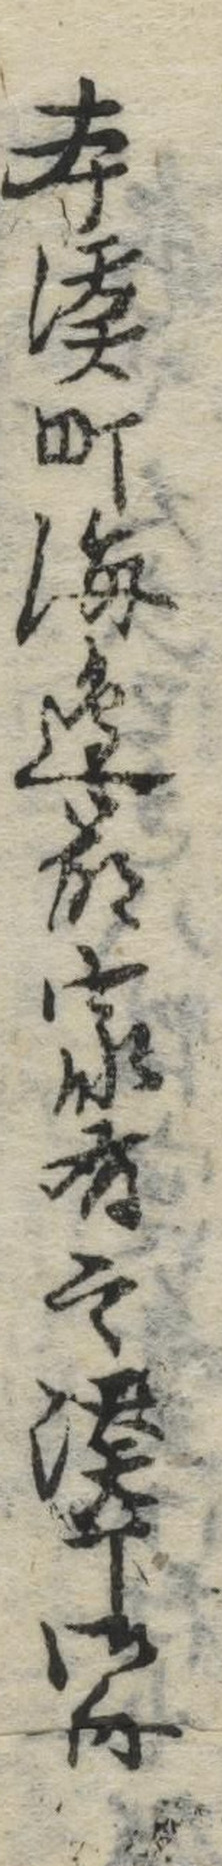本湊町海辺崩家有之湊丁御舟
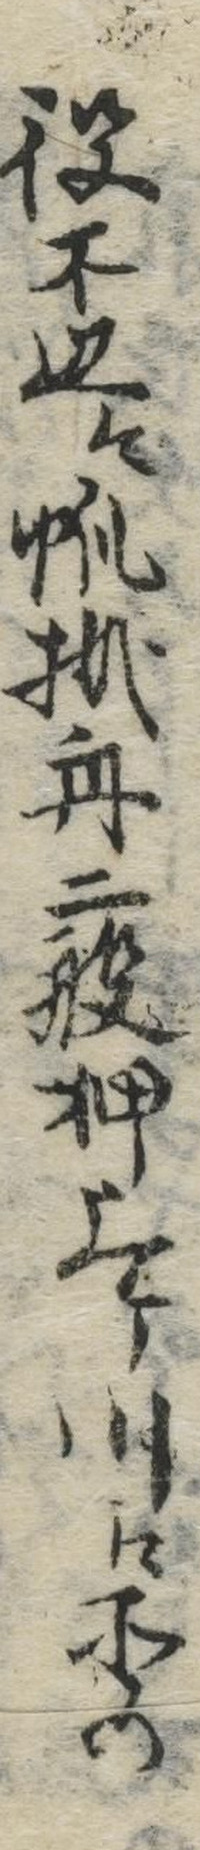役所辺江帆掛舟二艘押上ヶ川江所の
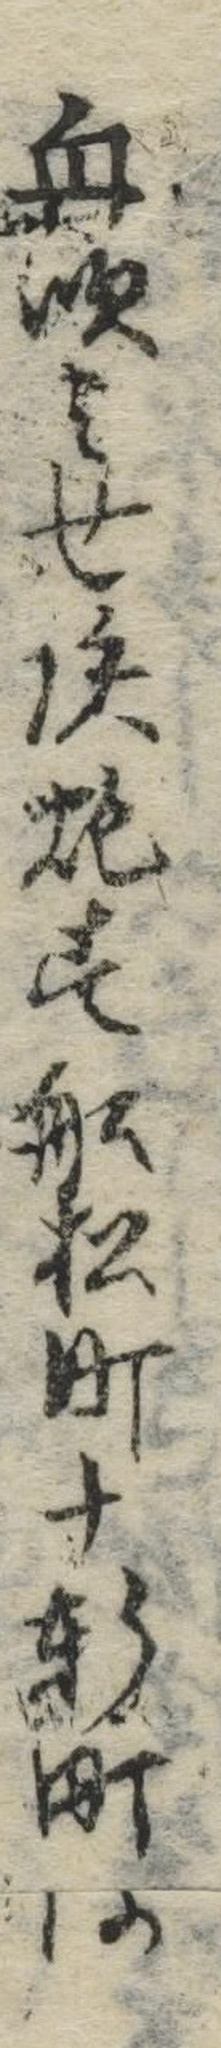舟吹よせ鉄炮す船松町十軒町河
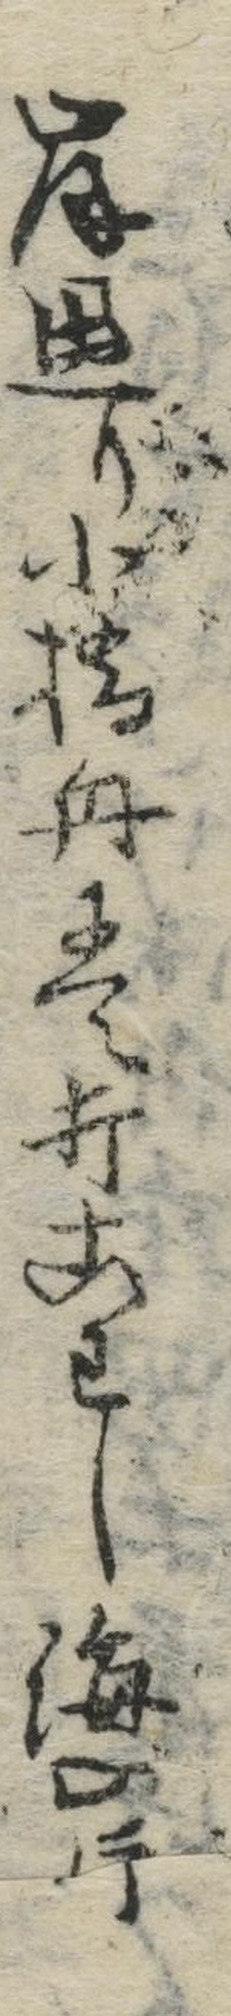岸通り小橋舟にて打こわし海岸
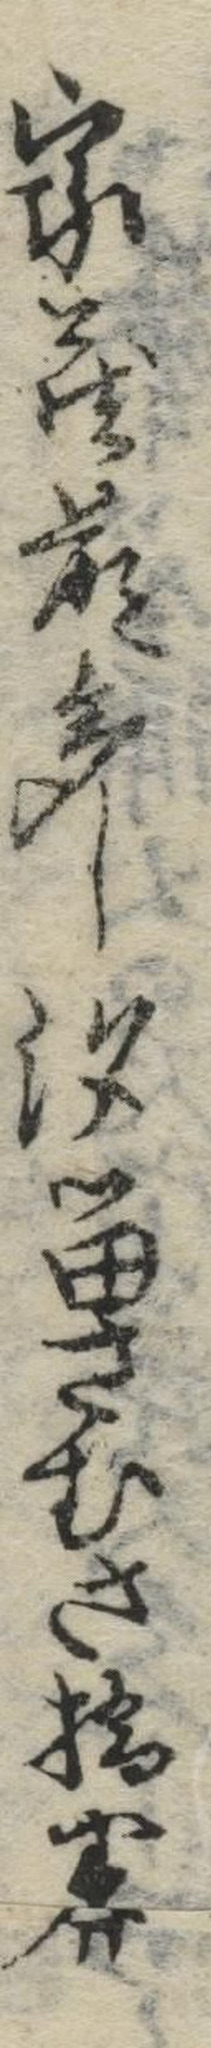家蔵崩多し汐留さむさ橋半分
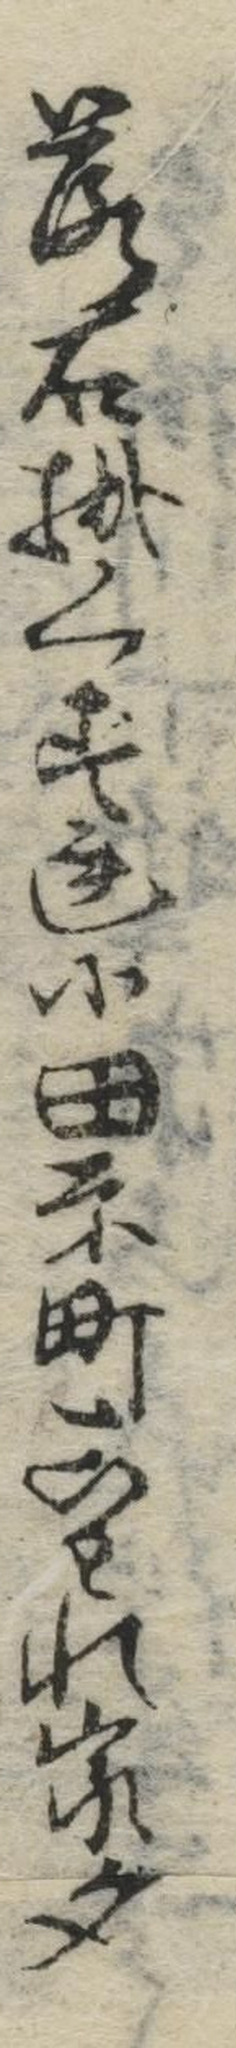落石掛くすれ小田原町こわれ家多
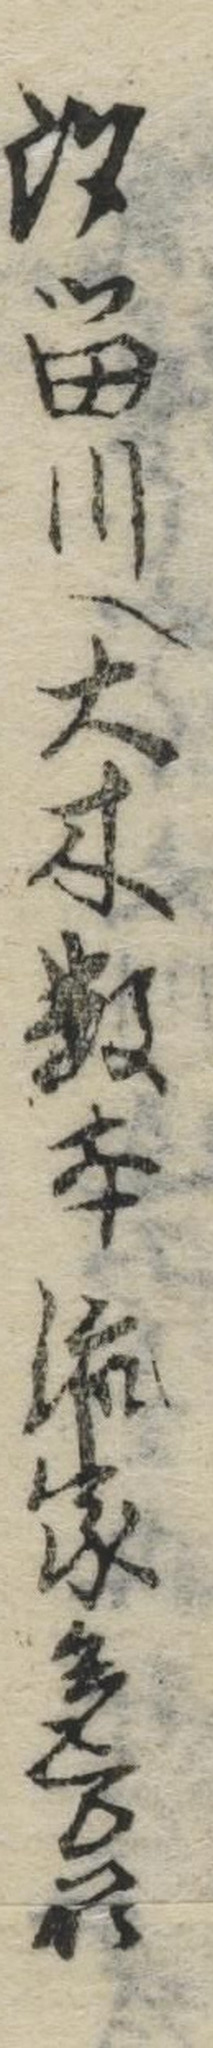汐留川へ大木数本流家多方崩
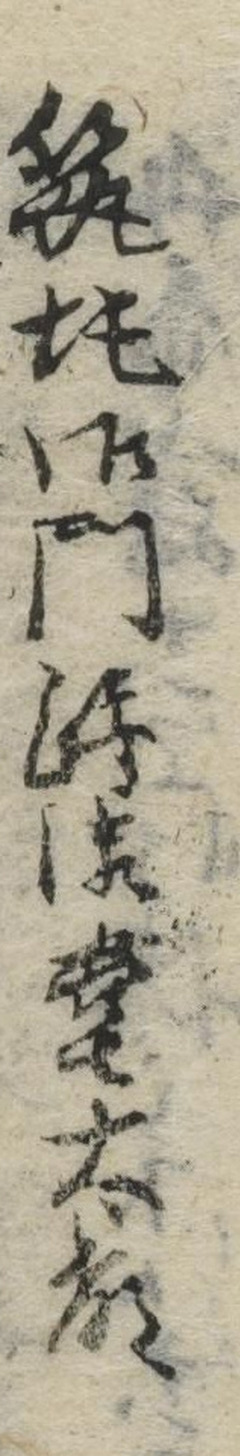築地御門跡御堂大崩
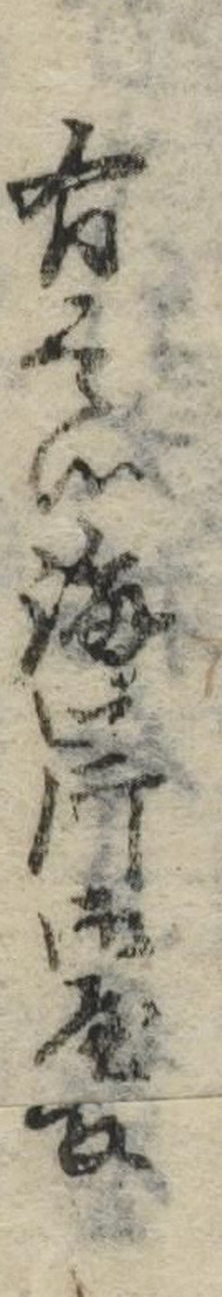有之候海岸御屋敷
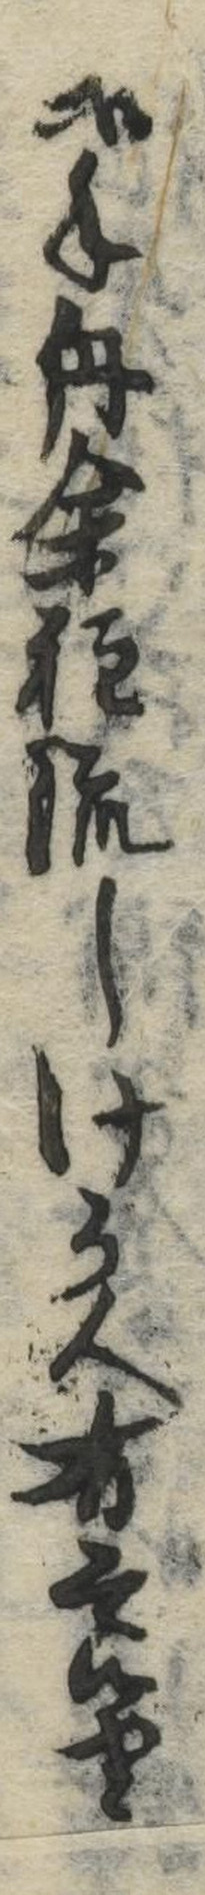御手舟余程流しけか人有之候由
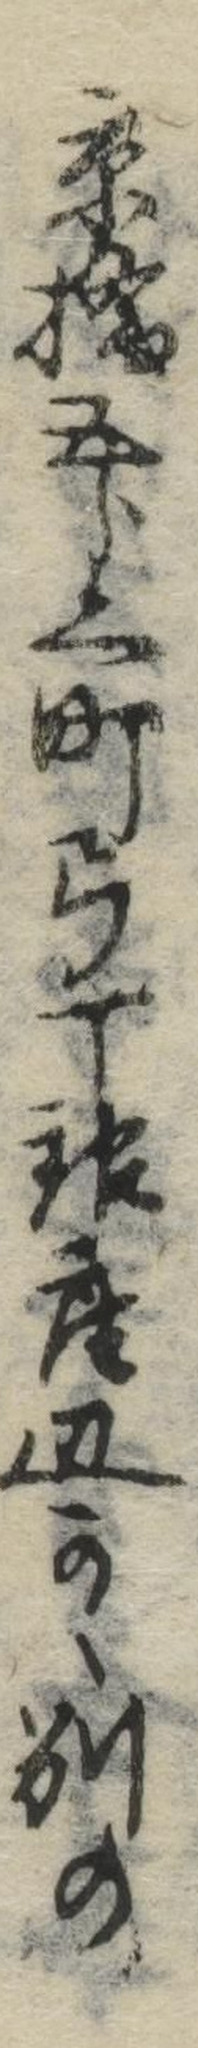京橋五郎兵衛町弓丁銀座辺かく別の
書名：安政三年辰八月廿五日夜　大江都御屋敷方寺社市中共　大嵐水入場所明細書之寫　并街道筋近郷聞書
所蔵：東京大学地震研究所図書室 Earthquake Research Institute Library, The University of Tokyo, JAPAN
